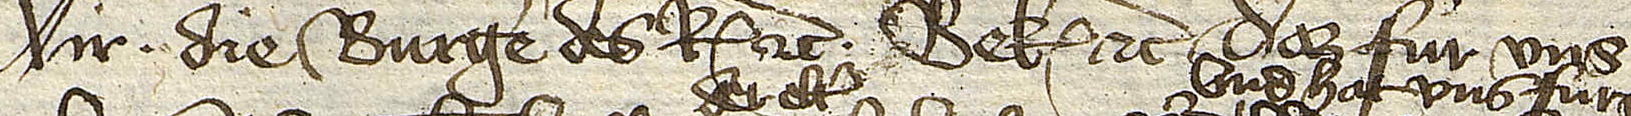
Wir ~ die Burge* des R* ec* . Bek* ec* / Daʒ für vns
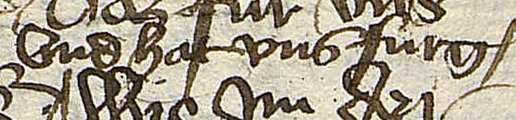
vnd hat vns fürg*
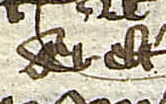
der elt*
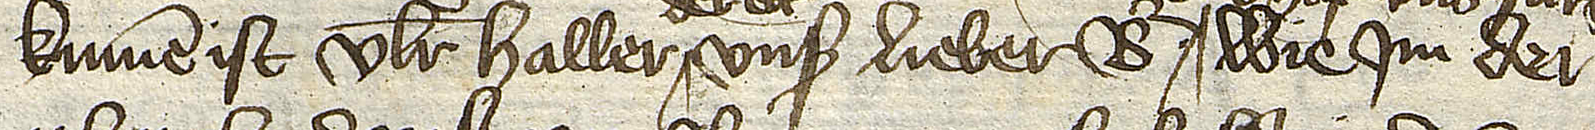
kume* iſt Vlr* haller vnſ* lieber B* Wie Im der
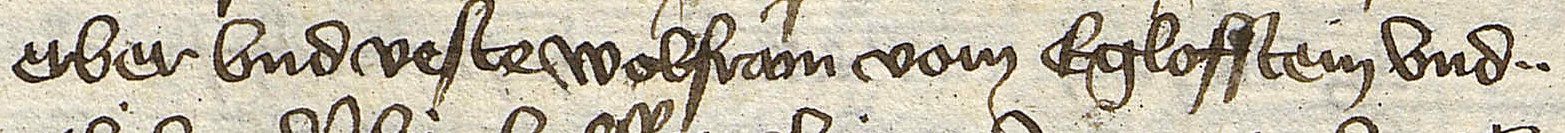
erber vnd veſte wolfram vom Eglofſtein vnd ~
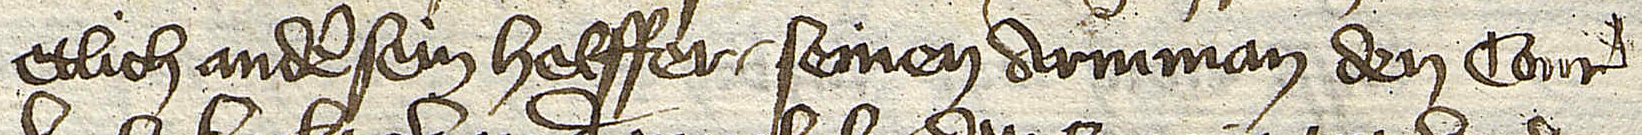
etlich ande* ſein helffer / ſeinen Armman den Conr*
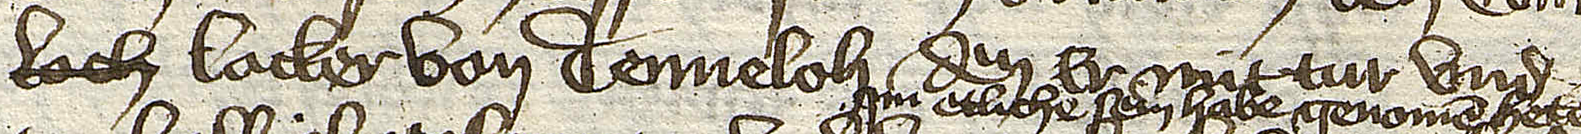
loch locker von Tenneloh / den Er mit tur vnd
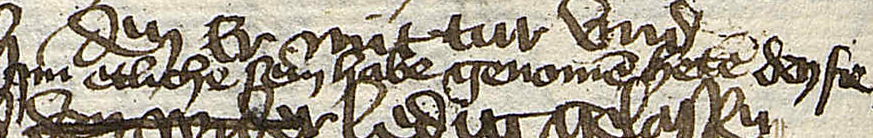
Im etliche ſein habe genome* hete* den ſie
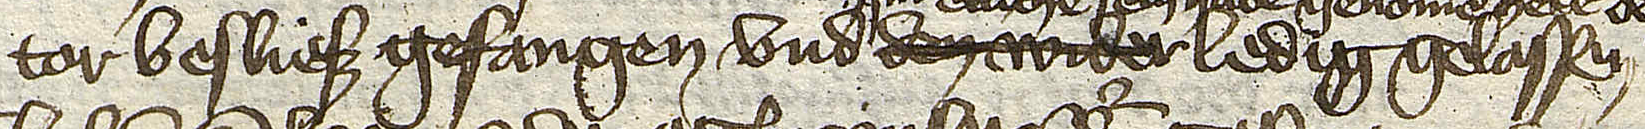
tor beſlieſʒ gefangen / vnd den wider ledig gelaſſen
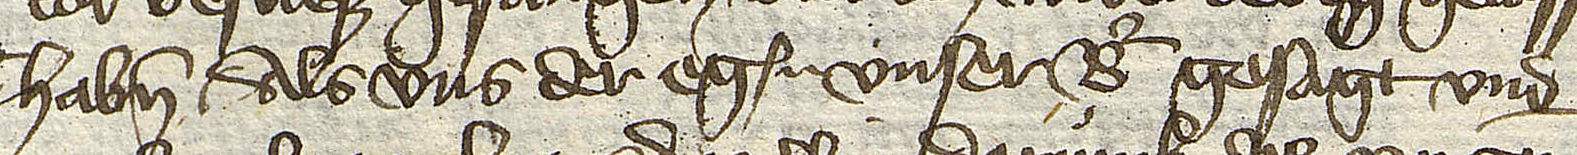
habn* / Als vns der eg* ~ vnſer B* geſagt vnd
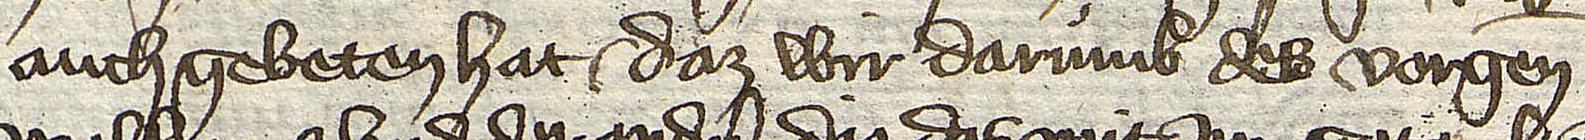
auch gebeten hat / daʒ wir darümb des vorgen*
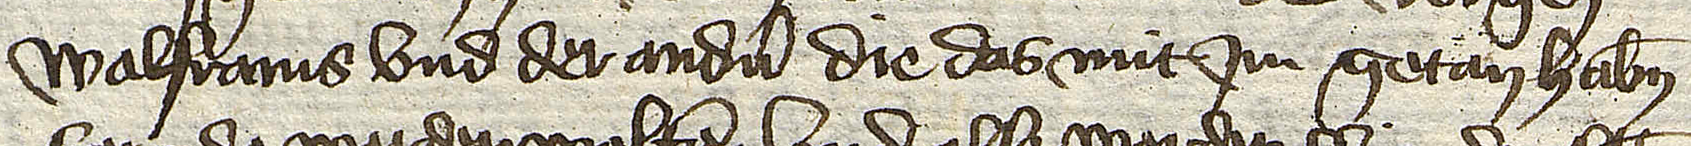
wolframs vnd der andn* die das mit Im getan habn*
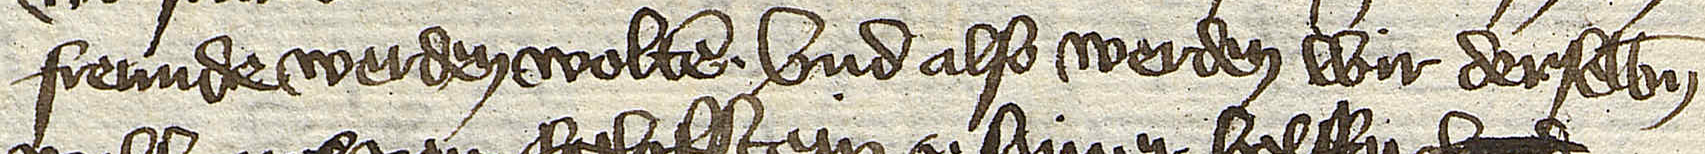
freunde werden wolte* . vnd alſo werden wir derſelbn*
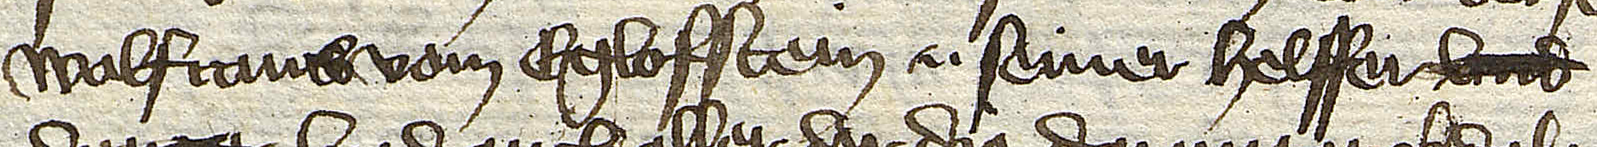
wolframs vom Eglofſtein / ~ ſeiner helffen vnd
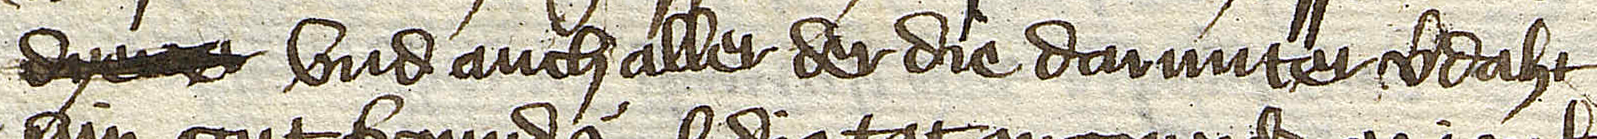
dyener vnd auch aller der die darunter v*daht
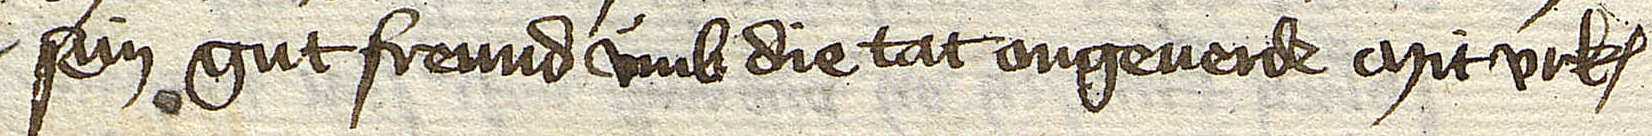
ſein gut freund v̈mb die tat ongeuerde Mit vrk*
